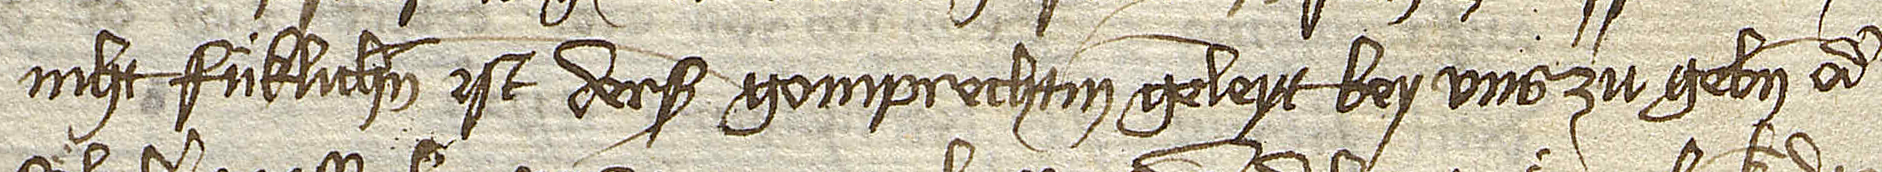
niht füklichn* iſt derſ* gomprechtin* geleyt bey vns ʒu gebn* od*
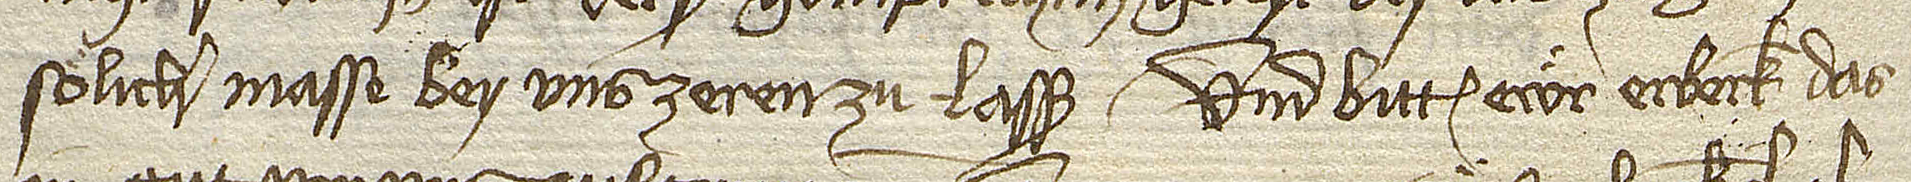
ſölich* maſſe bey vns ʒeren ʒu laſſ* / Vnd bitt* eẅr erberk* das
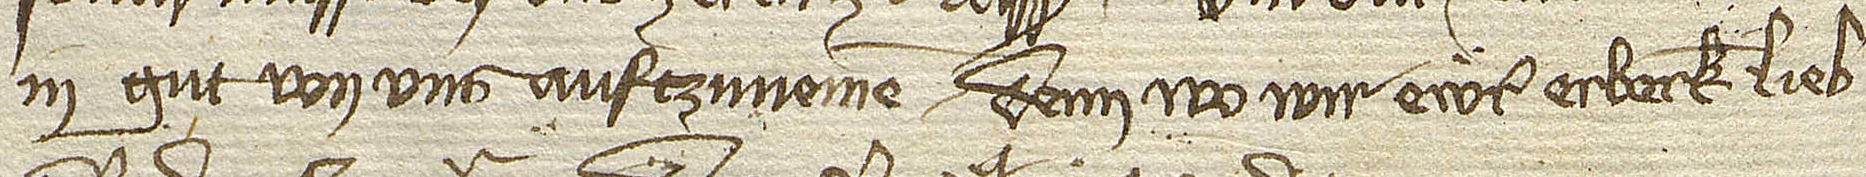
in gut von vns aufcʒuneme* / Denn wo wir eẅr* erberk* lieb
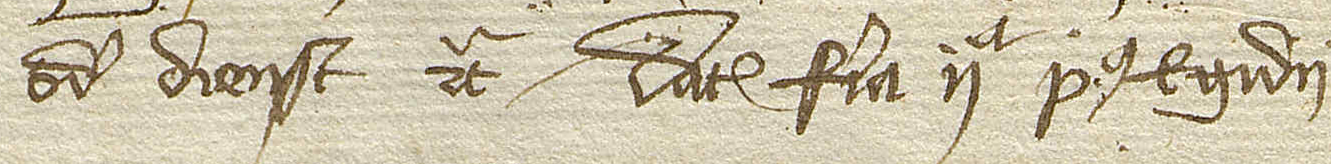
od* dienſt ec* / Dat* fi*a ii* p* Egidii
